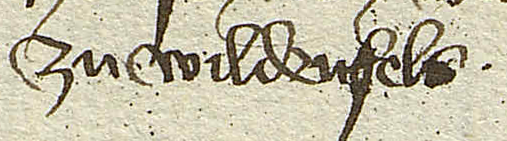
cʒu wildenfels
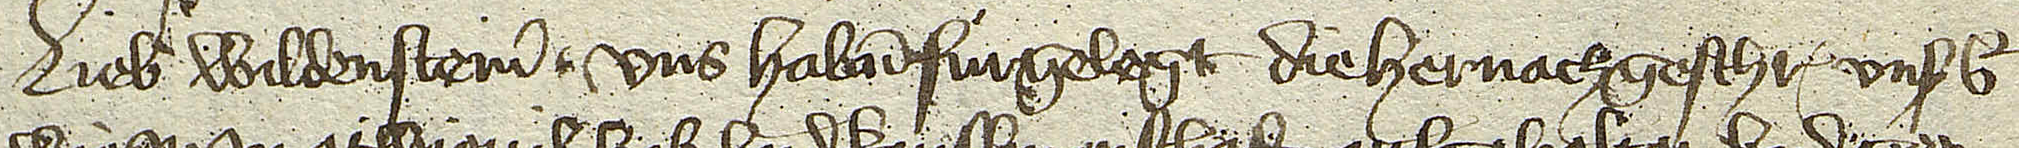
Lieb* wildenſtein* / vns habn* fürgelegt die hernachgeſchr* vnſ* b*
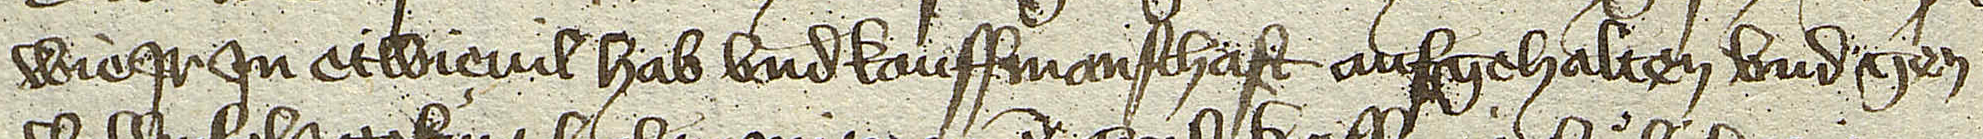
wie Ir In etwieuil hab vnd kauffmanſchaft aufgehalten vnd gen
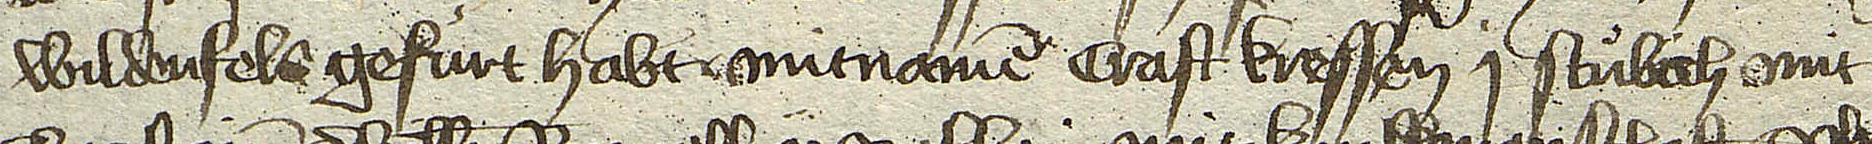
wildenfels gefürt habt / mitname* Craft kreſſen i ſtüb%%% mit
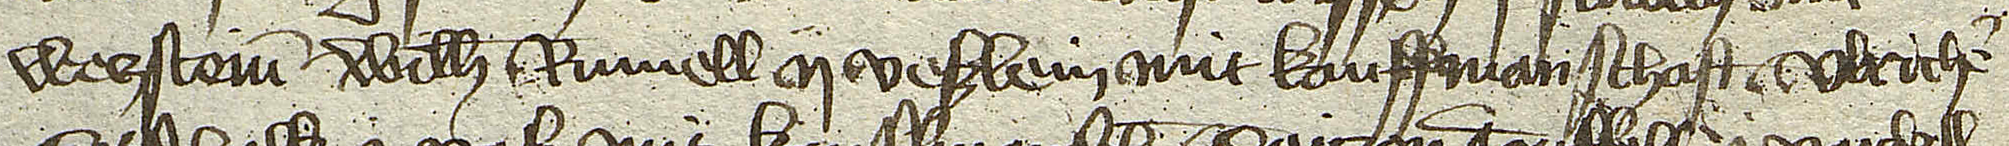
wecʒſtein* / wilh* Rumell ii veſʒlein mit kauffmanſchaft / vlriche*
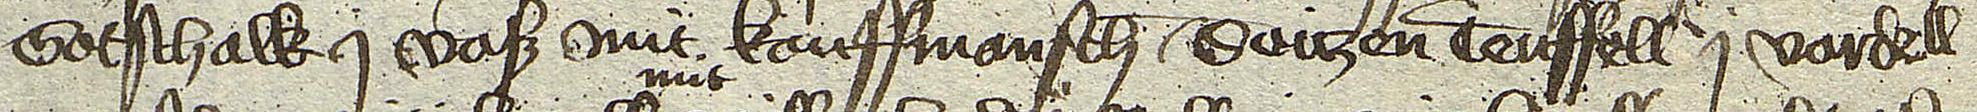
Gotſchalk i vaſʒ mit kauffmanſch* / Seicʒen Teuffell i vordell
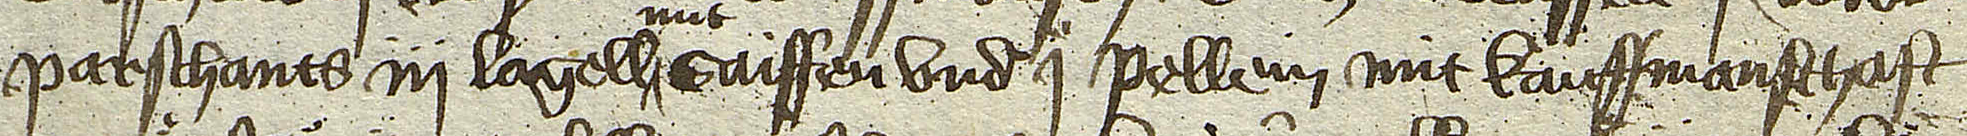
parſchants iii lagell Saiffen vnd i pellein mit kauffmanſchaft
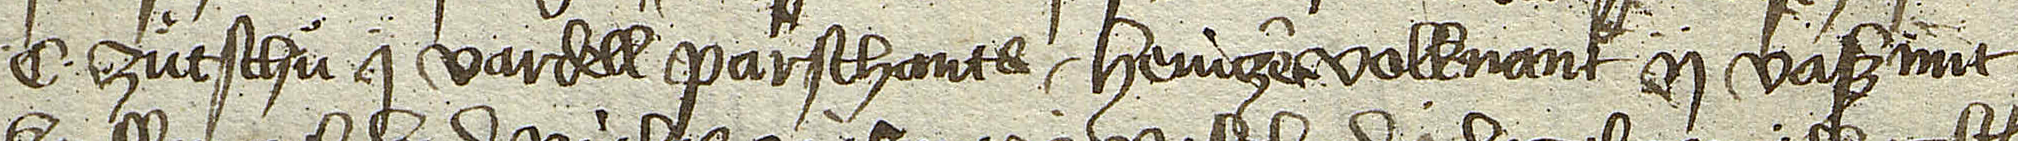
C . cʒütſch% i vardell parſchants / heincʒe* volknant ii vaſʒ mit
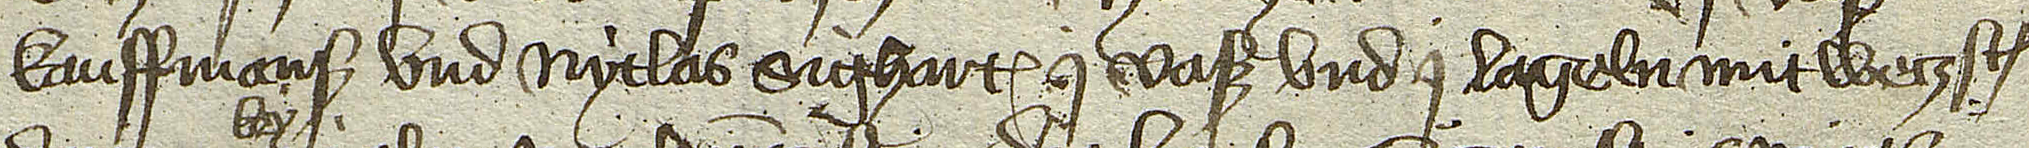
kauffmanſ* vnd Nyclas Sighart* i vaſʒ vnd i lageln mit wecʒſt*
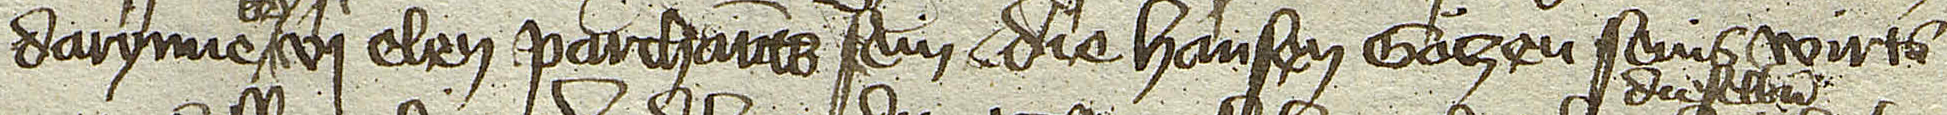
darynne vi elen parchants* ſein / die hanſen Göcʒen ſeins wirts
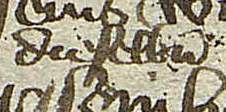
dieſelbn*
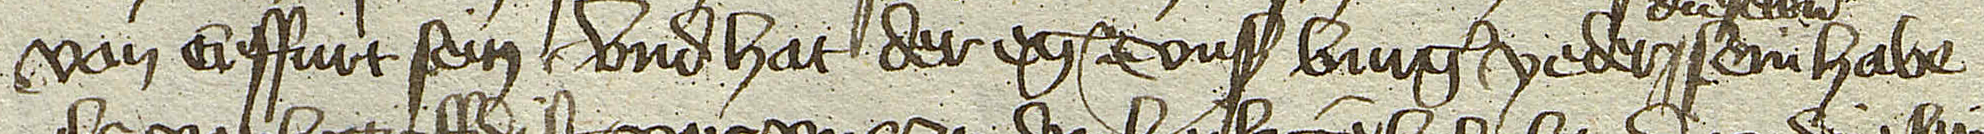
von Erffurt ſein / Vnd hat der eg* ~ vnſ* burg* / yeder ſein habe
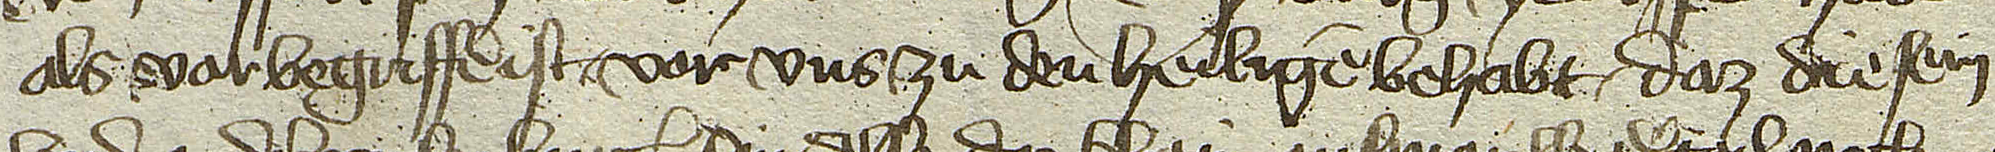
als vor begriffe* iſt / vor vns cʒu den heilige* behabt / daʒ die ſein
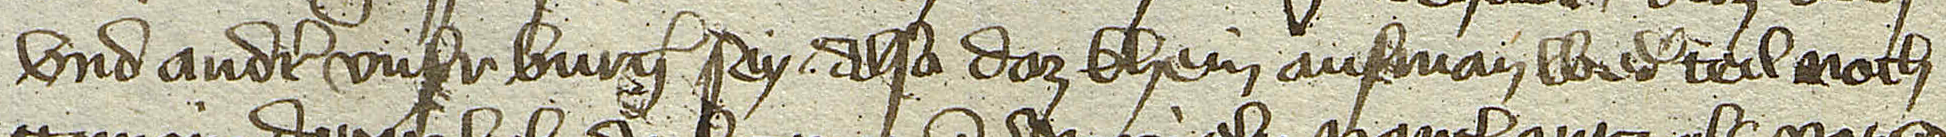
vnd andr* vnſ*r burg* ſey / Alſo daʒ khein auſman wed* teil noch
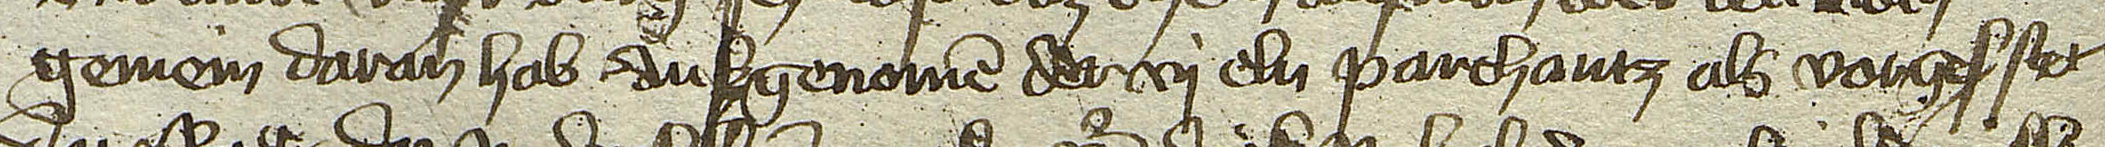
gemein daran hab / Auſʒgenome* der vi* eln parchantʒ als vorgeſ* ſtet
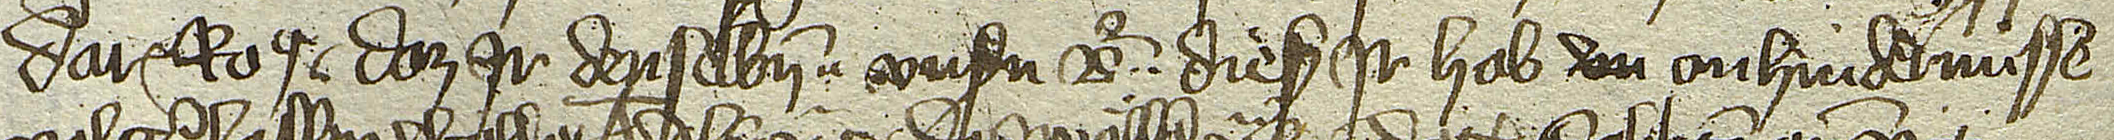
Dar* Ro* / daʒ Ir denſelbn* ~ vnſ*n B* dieſ* Ir hab vn on hindernüſſe
